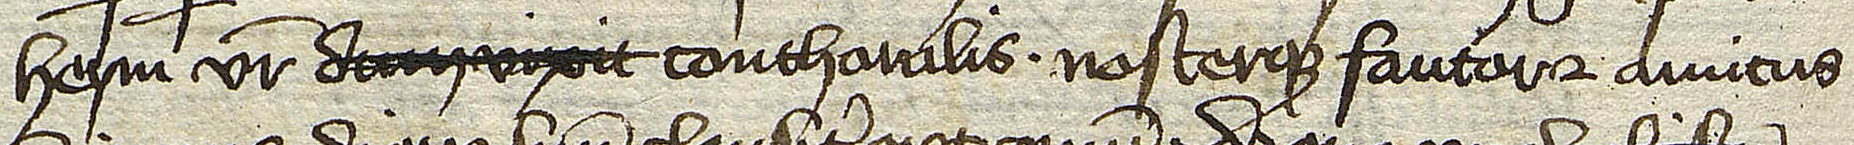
Heym v*r dum vixit conthoralis . noſterq* fautor @ amicus
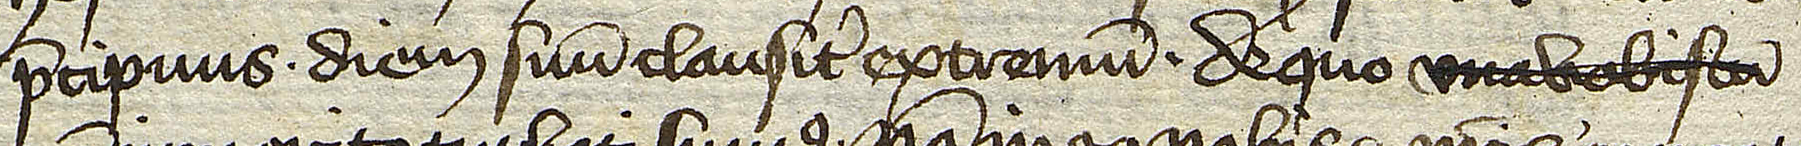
p*cipuus . diem ſuu* clauſit* extremu* . De quo vna%%biſta*
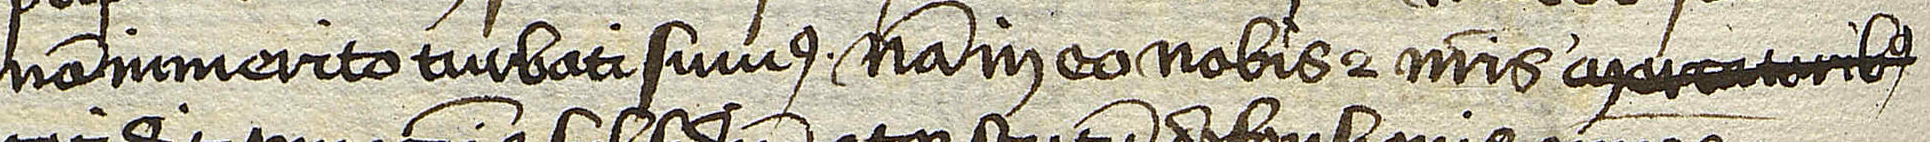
no* inmerito turbati ſum* . Na* in eo nobis @ n*ris Mercatorib*
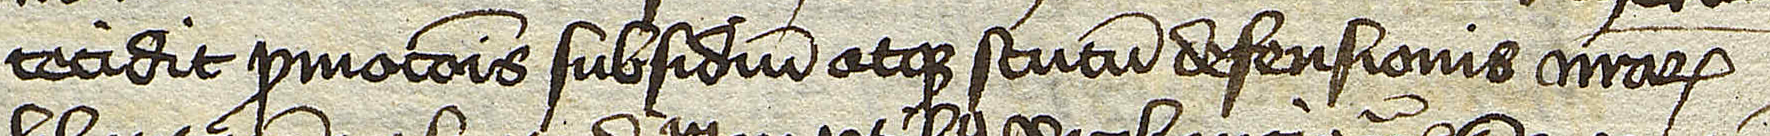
cecidit p*moc*o*is ſubſidiu* atq* ſcutu* defenſionis n*ro*
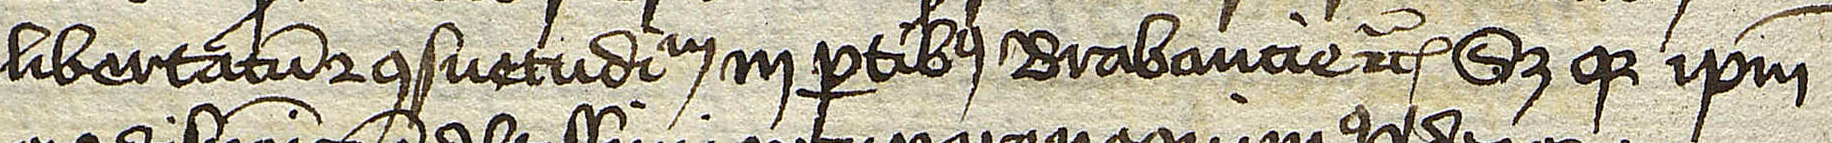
libertatu* @ *ſuetudi* in p*tibus Brabantie ec* S*q* ip*m
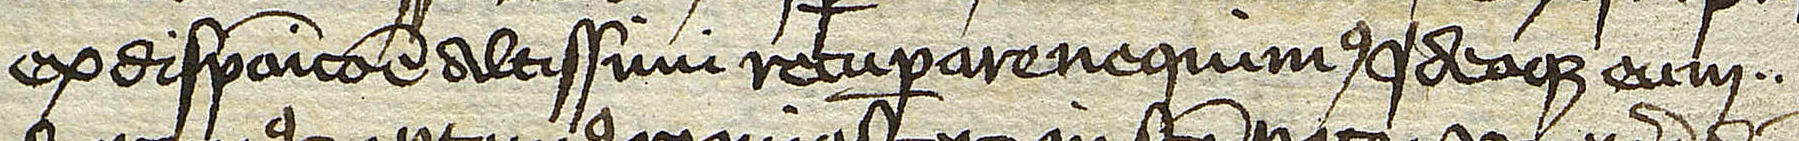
ex diſpo*ic*o*e Altiſſimi recup*are nequim* Ideoq* eum . .
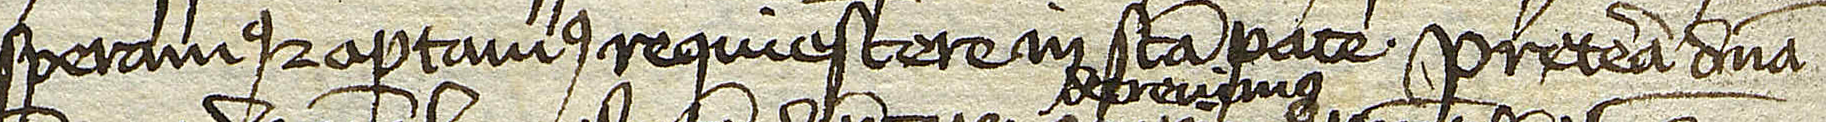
ſperam* @ optam* requieſcere in ſ*ta pace . prete*a d*na
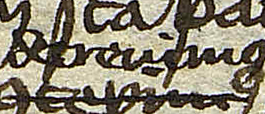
decreuim*
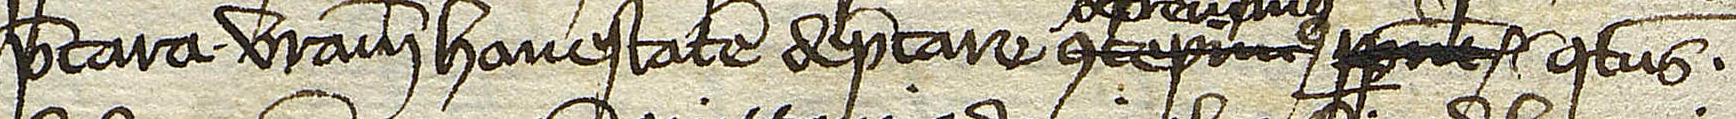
p*cara . v*ram honeſtate* dep*care *cepim* ppnt* q*t*us .
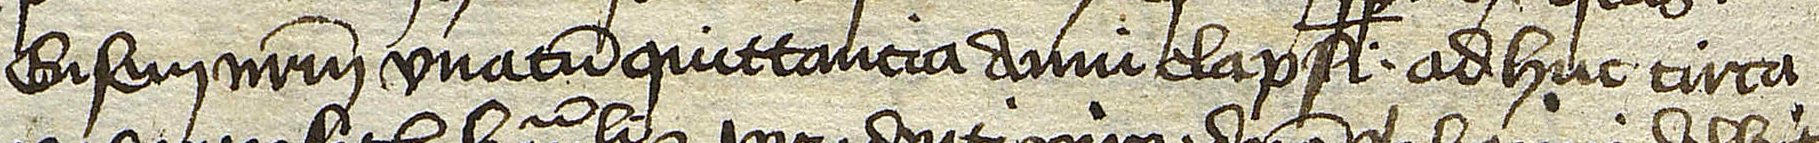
Enſem n*r*m vnacu* quittancia Anni elapſi . ad huc circa
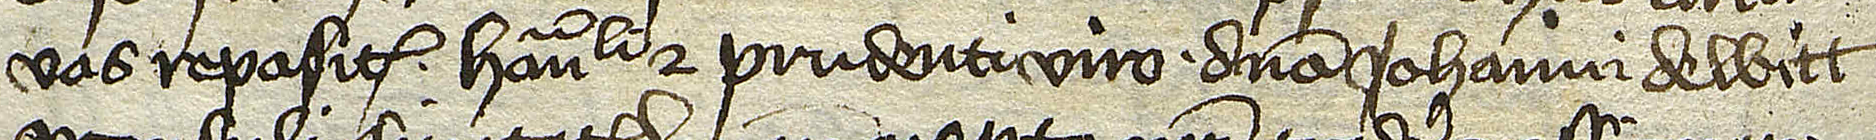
vos repoſit* . hon* @ prudenti viro . d*no Iohanni Dewitt
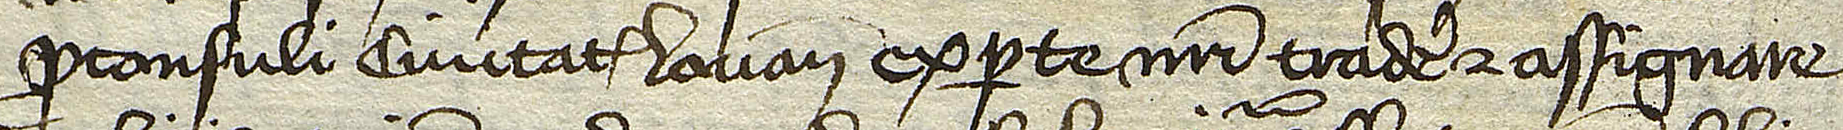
p*conſuli Ciuitat* Louan* ex p*te n*ri trade* @ aſſignare
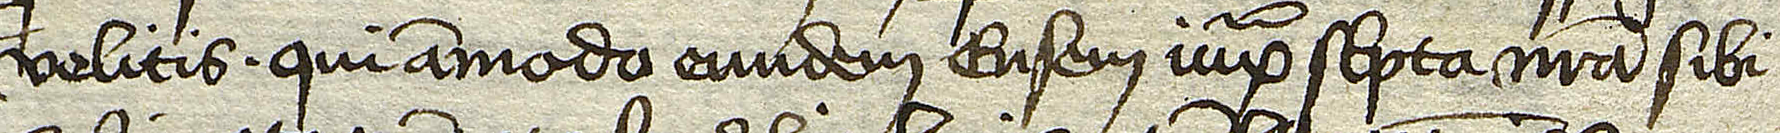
velitis . qui a*modo eundem Enſem iux* ſc*pta nra* ſibi
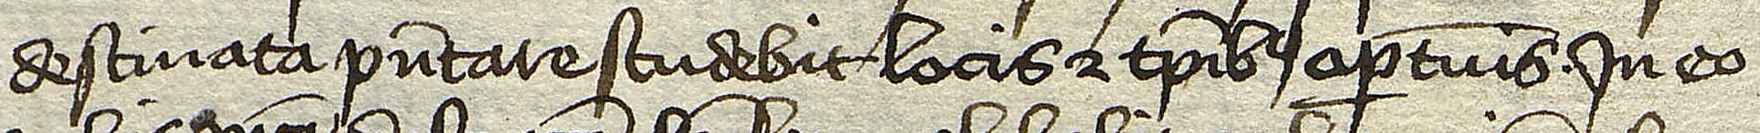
deſtinata p*ntare ſtudebit locis @ t*p*ib* ap*tuis . In eo
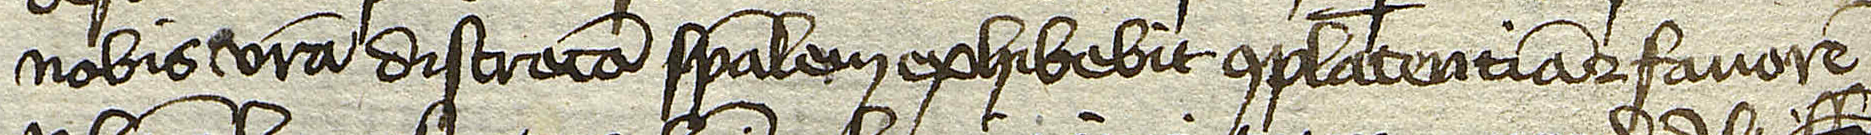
nobis v*ra diſtrac*o ſp*alem exhibebit *placencia* @ fauore*
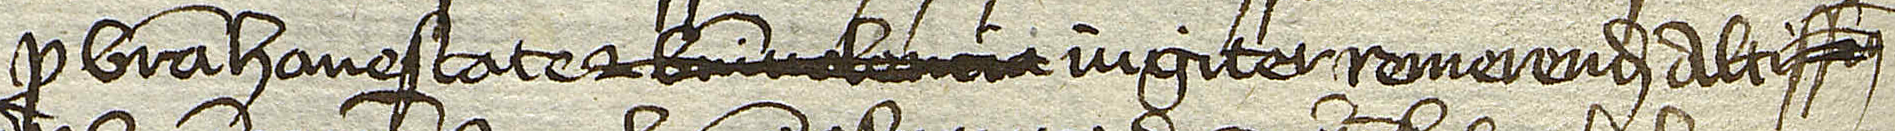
p* v*ra honeſtate @ bniuolencia* iugiter remerend* Altiſſi*
